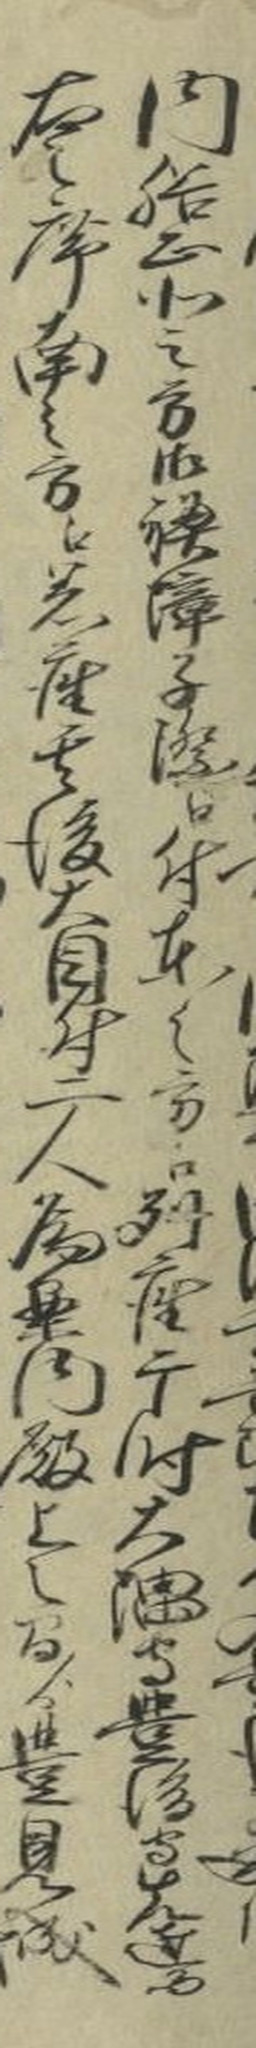右之席南之方え着座其後大目付二人為案内殿上之間ゟ豊見城
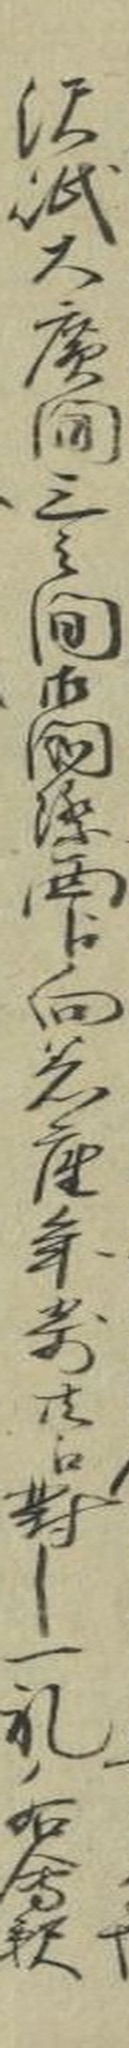沢岻大広間三之間御閾際西え向着座年寄共え対し一礼各会釈
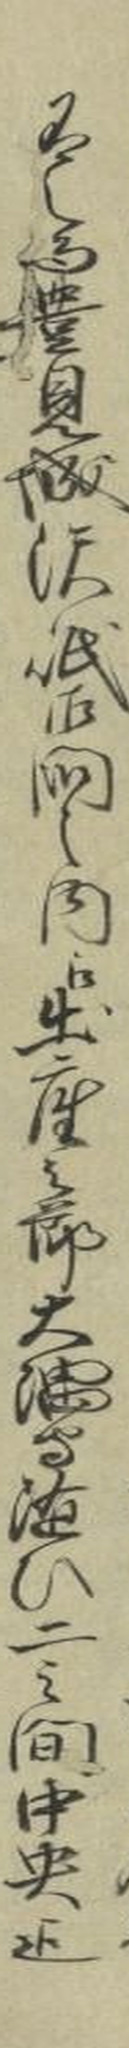有之て豊見城沢岻御閾之内え出座之節大隅守随ひ二之間中央迄
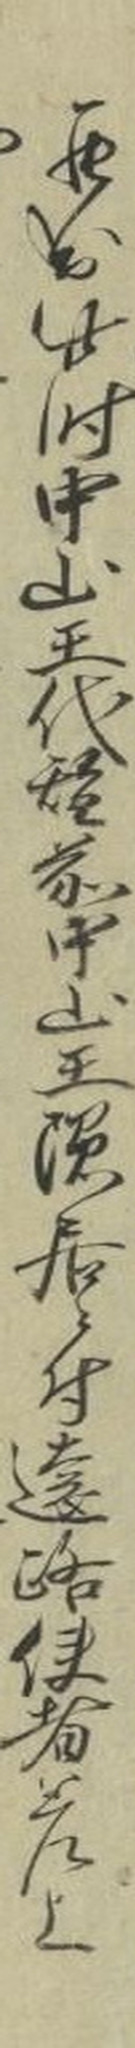罷出此時中山王代替前中山王隠居に付遠路使者差上
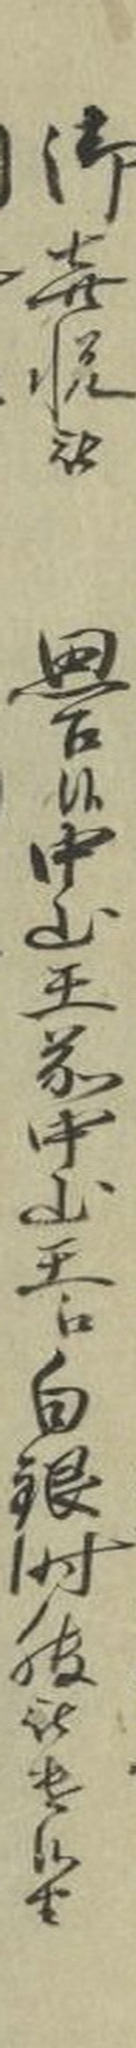御喜悦被思召候中山王前中山王え白銀時服被遣候由
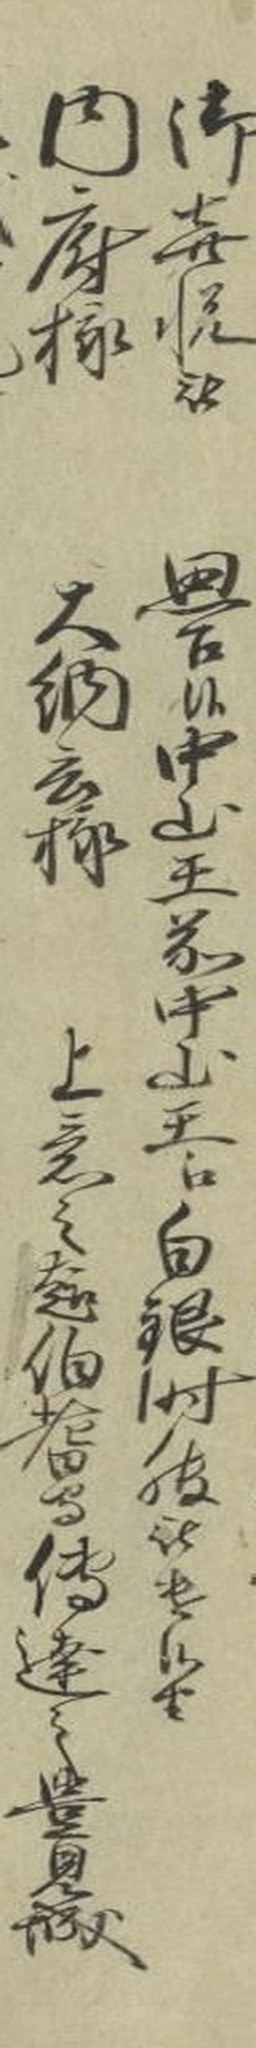内府様大納言様上意之趣伯耆守伝達之豊見城
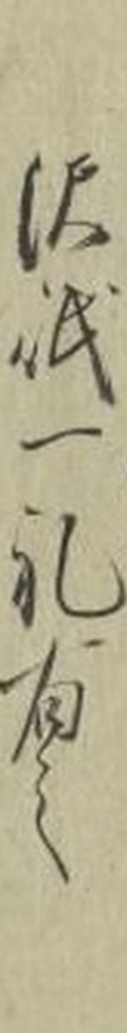沢岻一礼有之
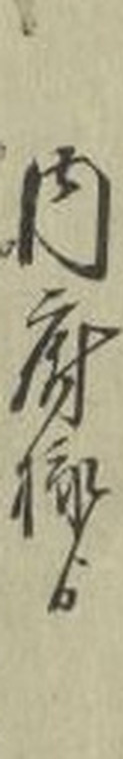内府様ゟ
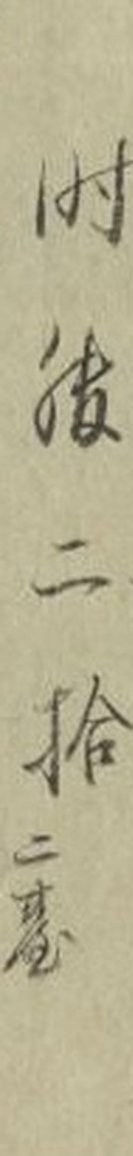時服二拾二台
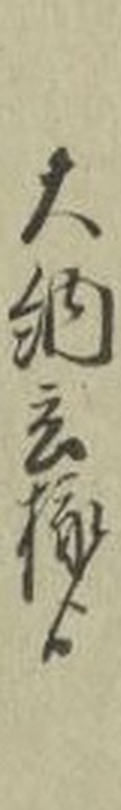大納言様ゟ
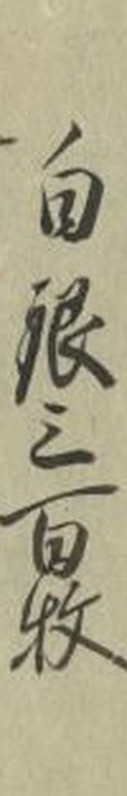白銀三百枚

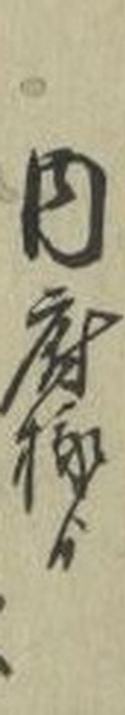内府様ゟ
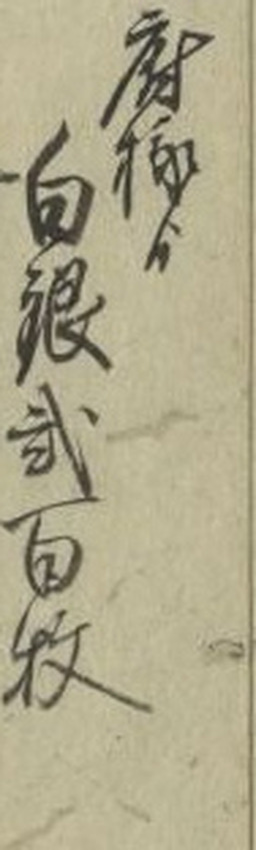白銀弐百枚
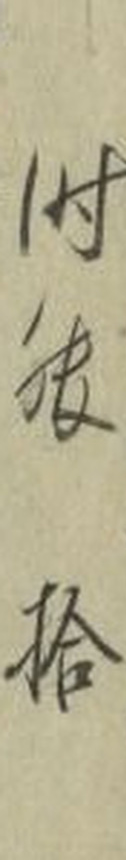時服拾
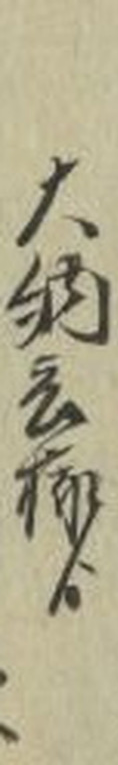大納言様ゟ
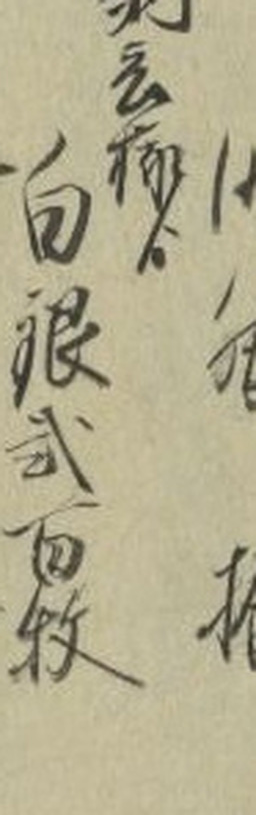白銀弐百枚
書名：天保三壬辰年琉球人参府之節勤方書留
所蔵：University of the Ryukyus Library
